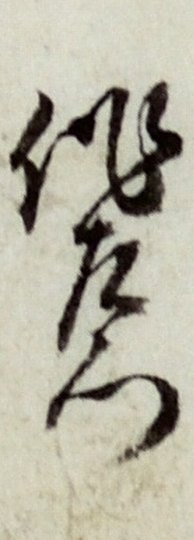与左衛門
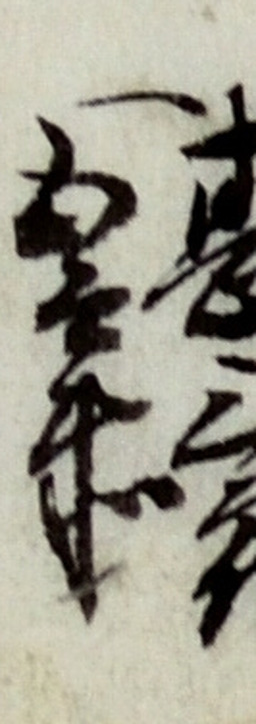五兵衛

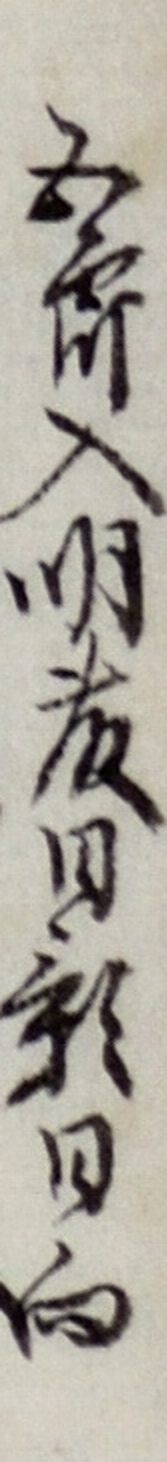五郎入明藤日影日向
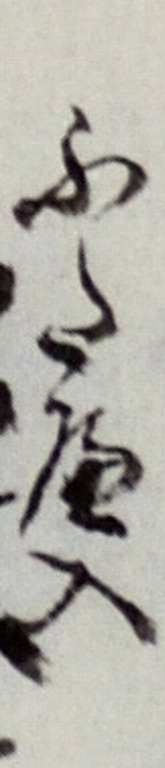ふたへ入
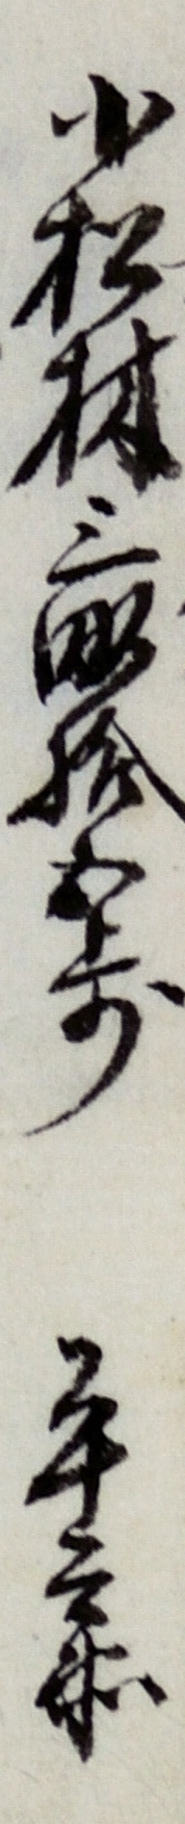小松林三畝拾五歩平兵衛
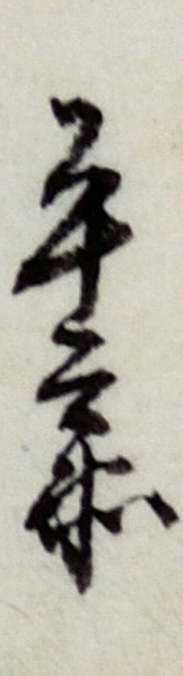九兵衛
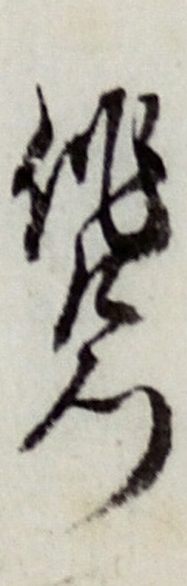市右衛門
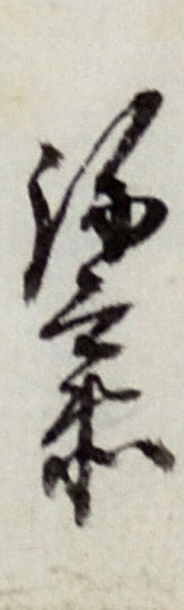九兵衛
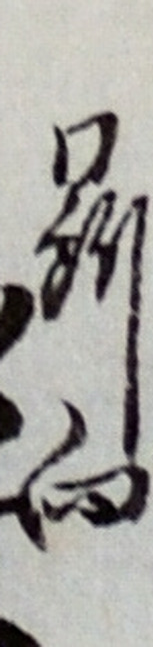同所向
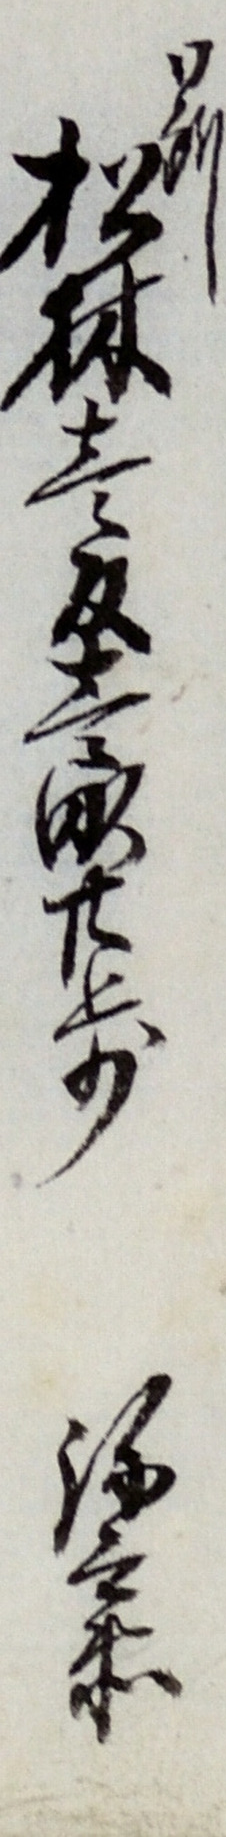松林壱反壱畝廿歩弥兵衛
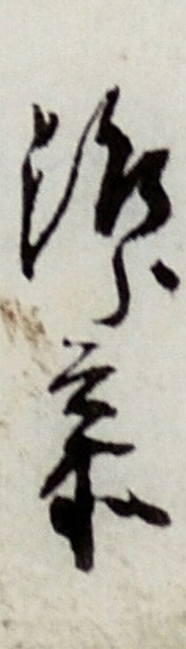治郎兵衛
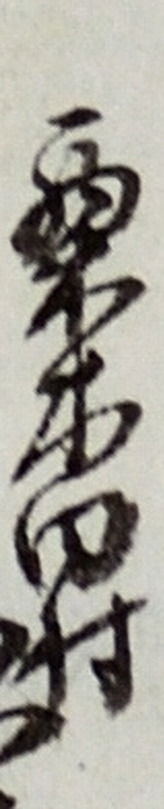栗木田村
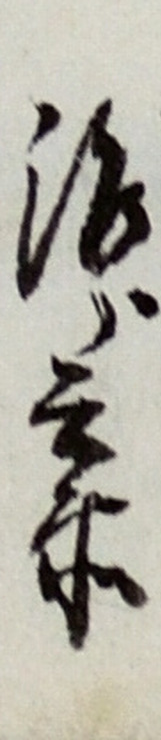治郎兵衛
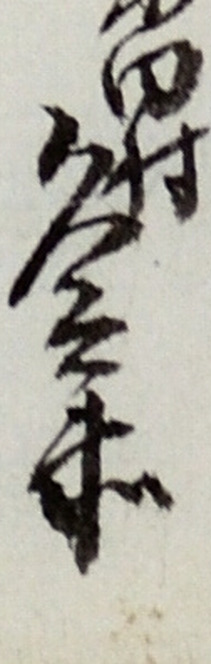九兵衛
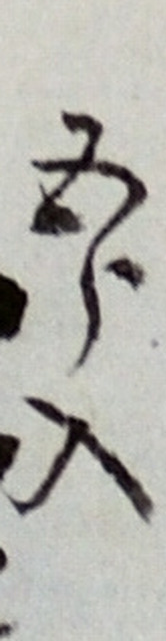五郎入
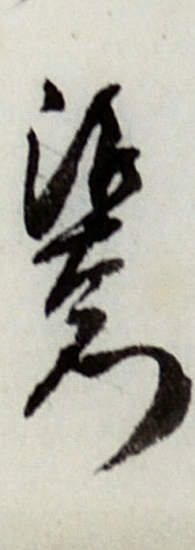市右衛門
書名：御領分中山林社地手控
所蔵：伊那市立高遠町図書館・合同会社AMANE
